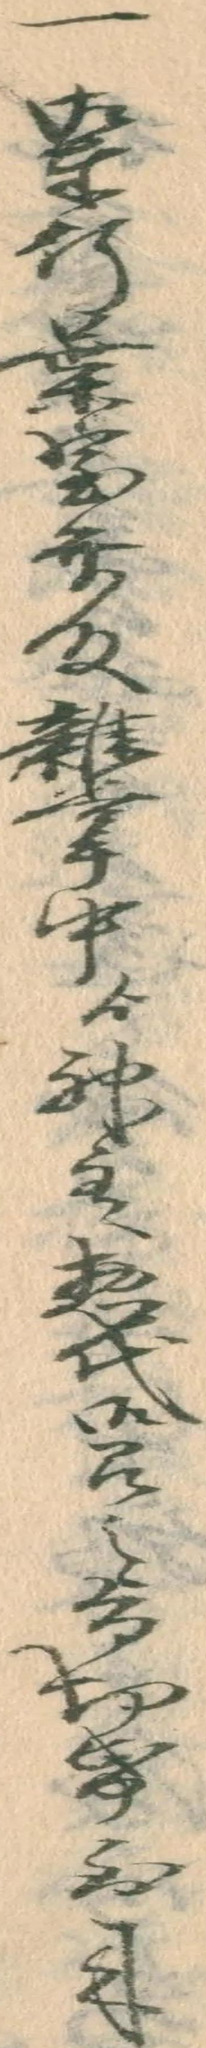一御奉行葉室弁殿雑掌中ゟ神主へ惣代御召之旨切帋到来
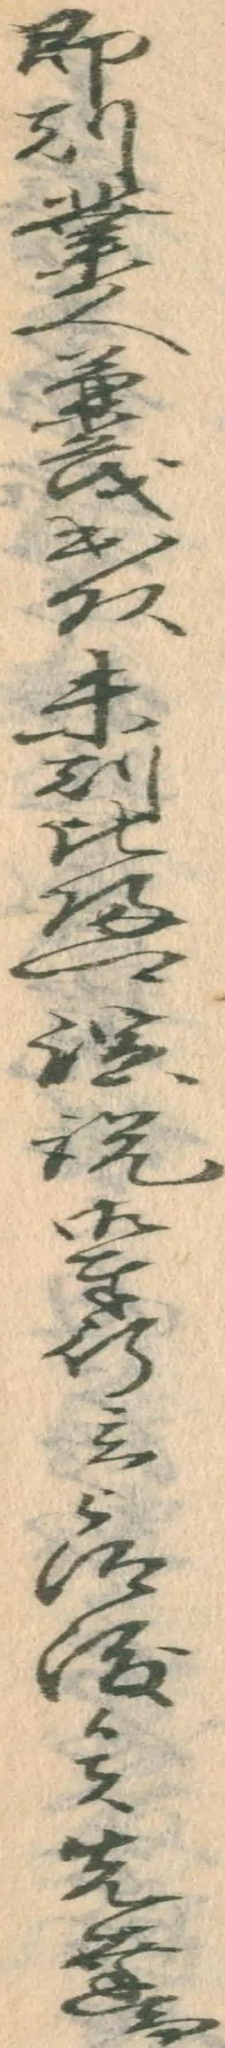即刻業久兼茂出頭未刻比帰郷演説御奉行ニ而被仰渡候者先達而

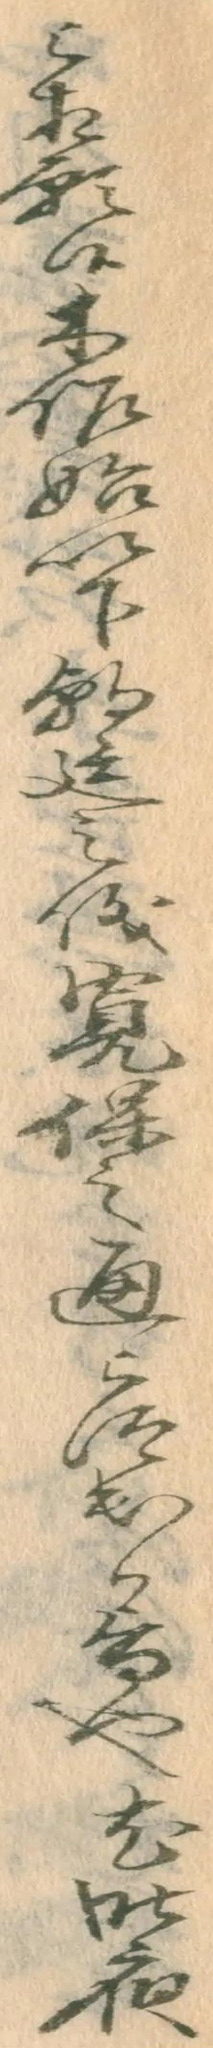被相願候木作始以下朝廷之儀寛保之通被仰出候旨也尤昨夜
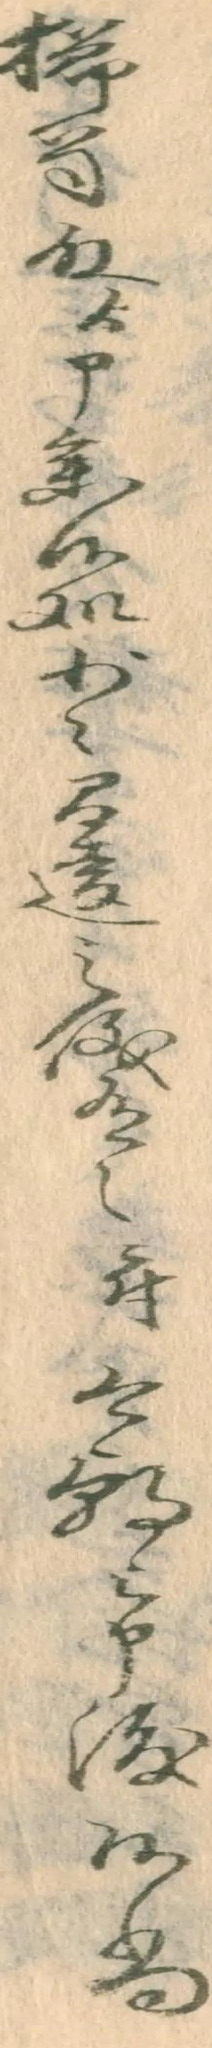櫛笥殿ゟ申参候処少々間違之儀有之ニ付今朝被申渡候尚
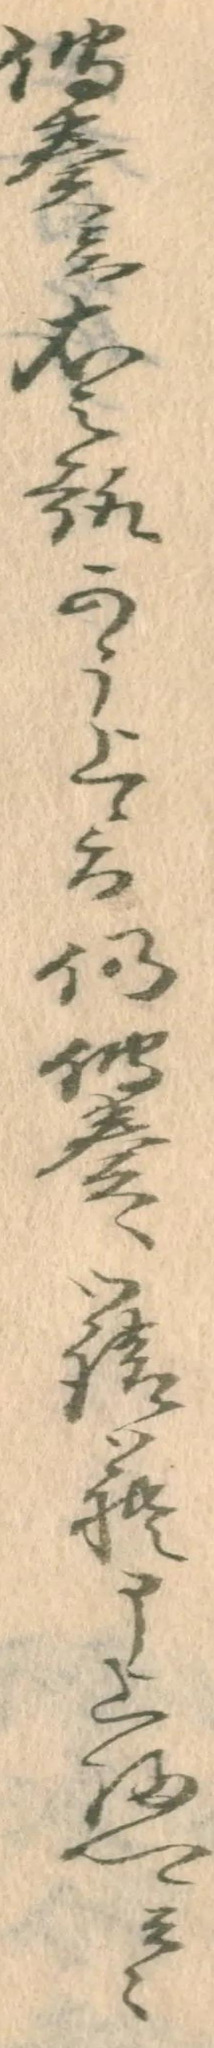伝奏ニ而右之趣可申上候旨仍伝奏へ御請御礼申上帰郷云々
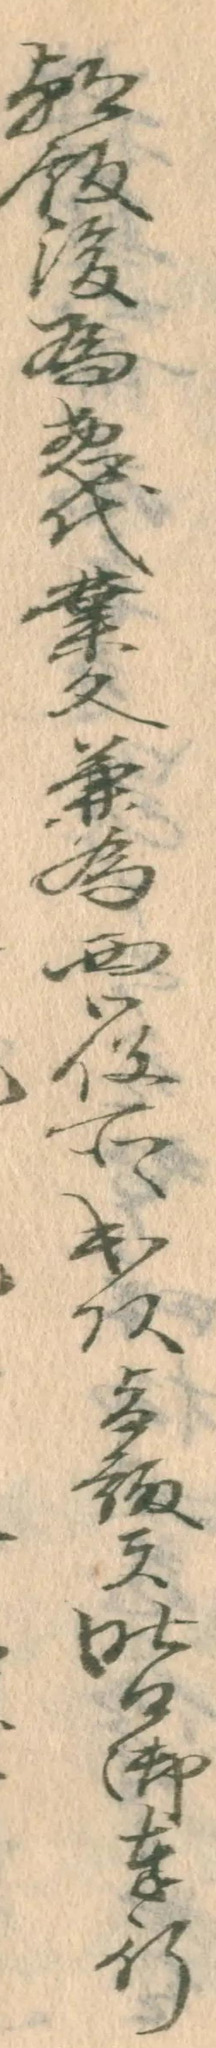一朝飯後為惣代業久兼為西御役所へ出頭旨趣は昨日御奉行
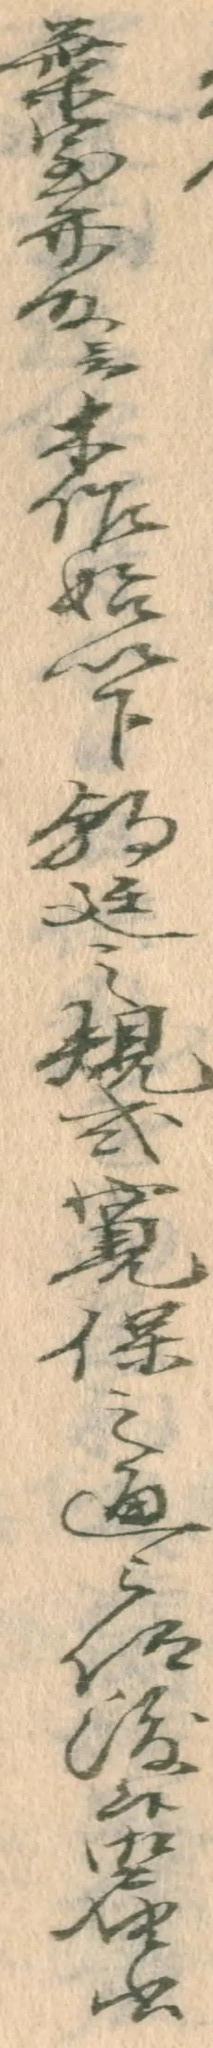葉宝弁殿ニ而木作始以下朝廷之規式寛保之通被仰渡候御届書
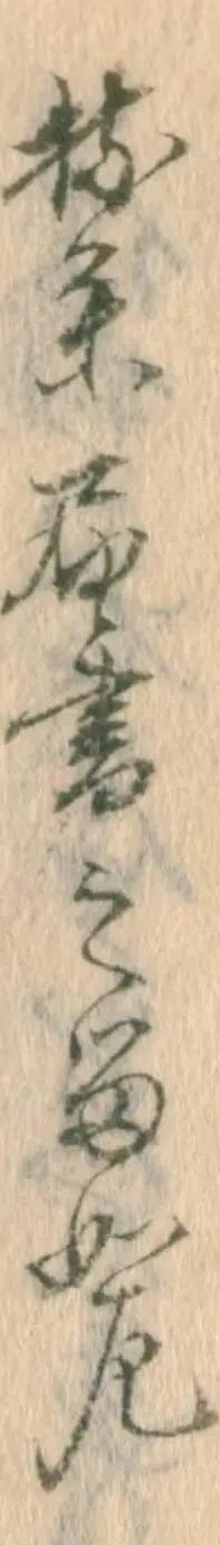持参届書之留如左
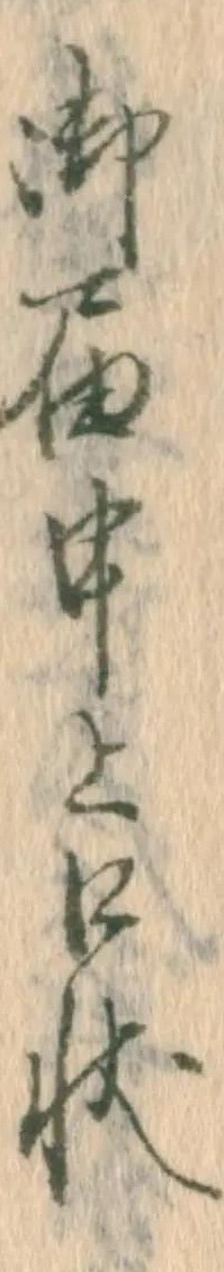御届申上口状
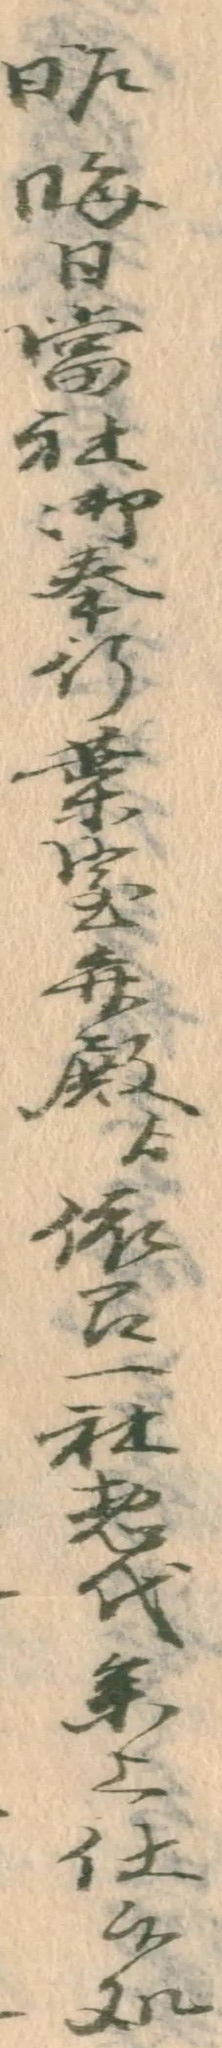昨晦日当社御奉行葉室弁殿ゟ依召一社惣代参上仕候処
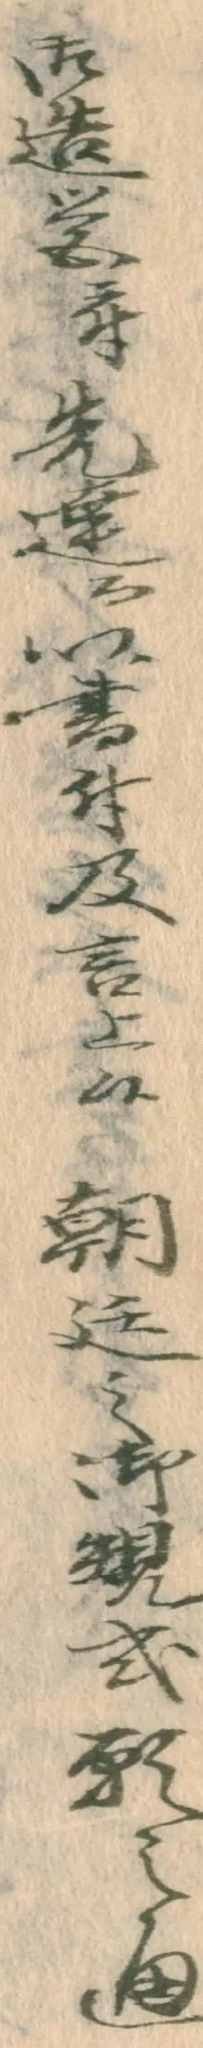御造営ニ付先達而以書付及言上候朝廷之御規式願之通
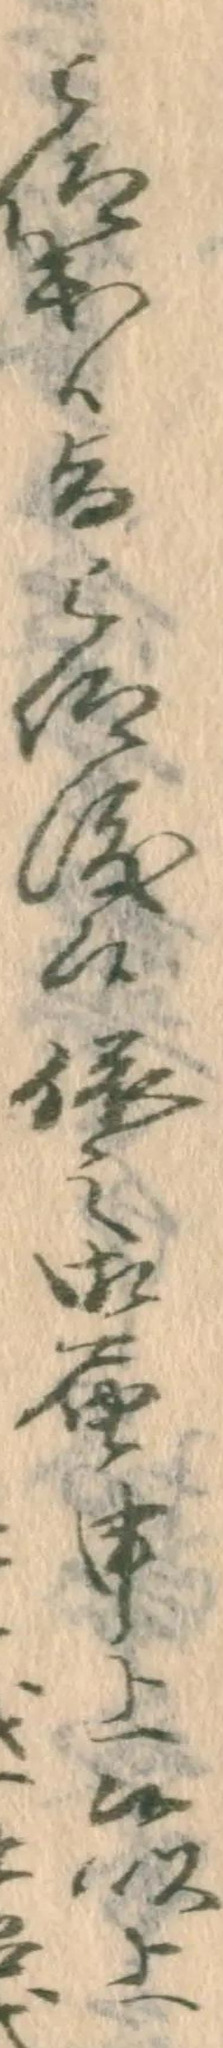被仰出候旨被仰渡候依之御届申上候以上
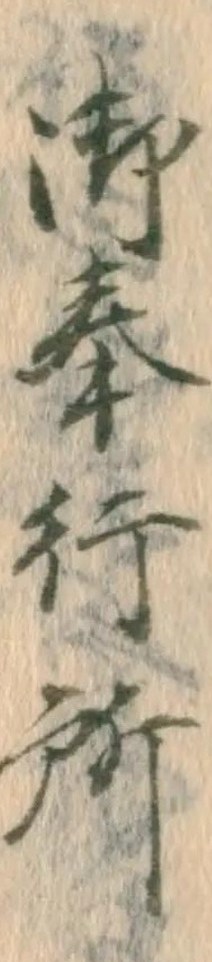御奉行所
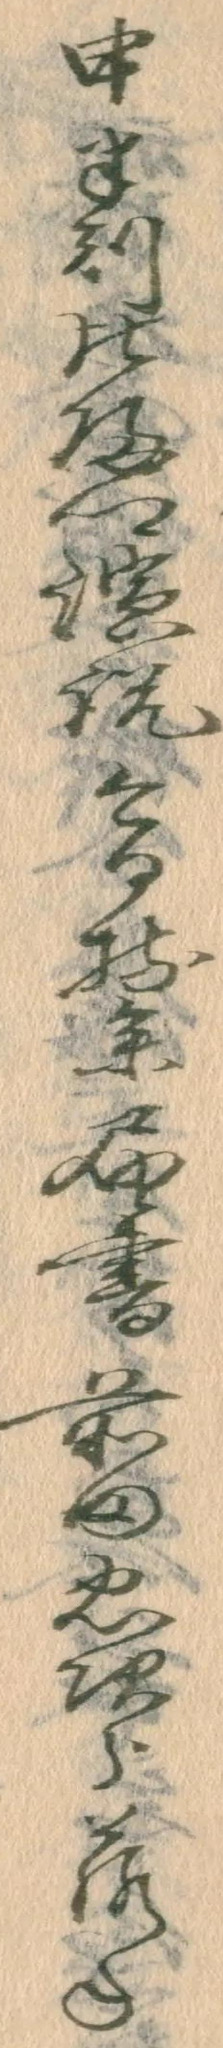申半刻比帰郷演説今日持参届書前田忠次郎落手
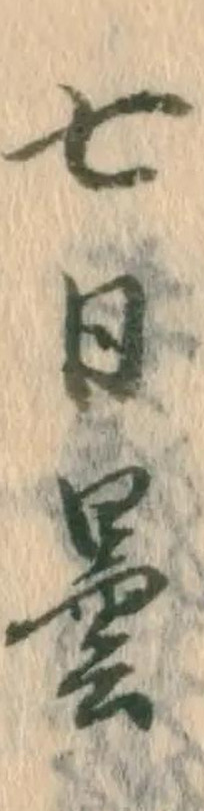七日曇
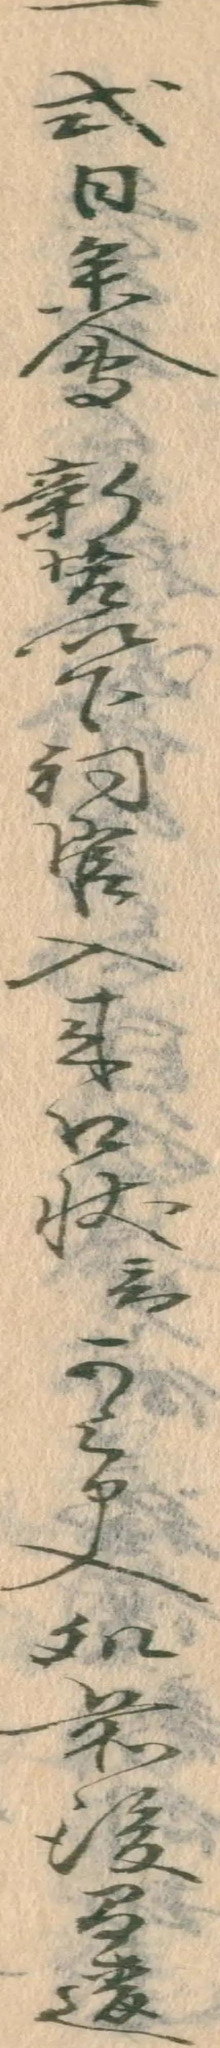一式日参会新宮以下祠官入来口状ニ而可被申入処前後間違
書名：賀茂社記録. 第17冊
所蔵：国立国会図書館 National Diet Library, JAPAN
